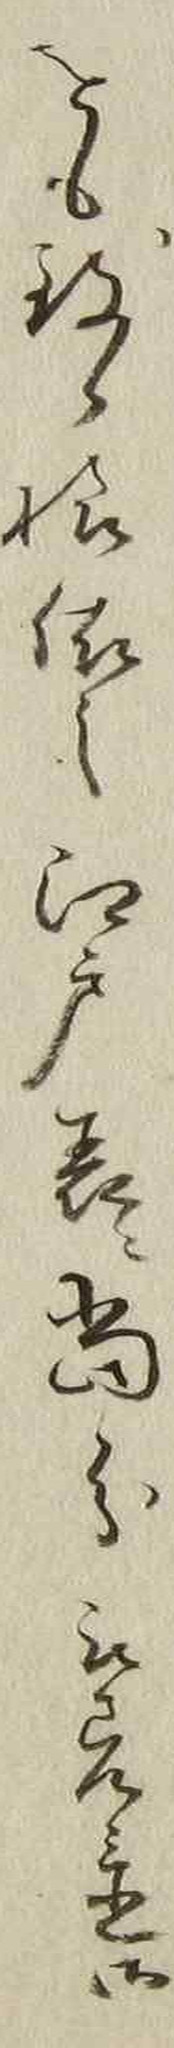をも致候様依之江戸表ニ当分被差置御
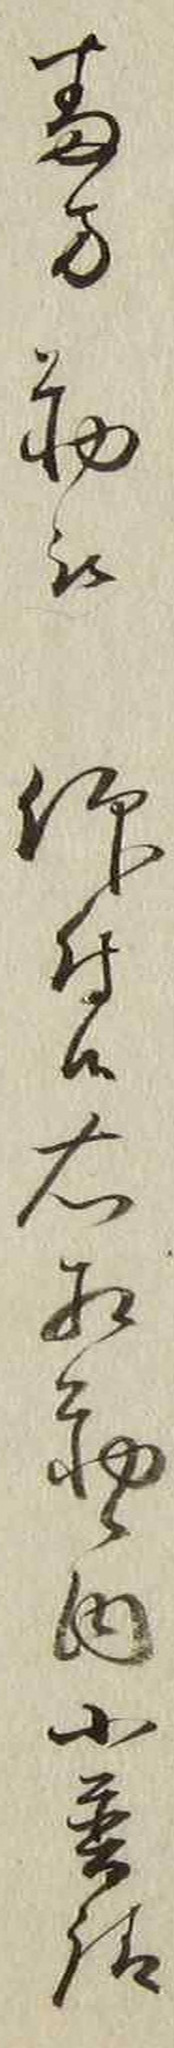番方勤被仰付候右相勤候内小普請
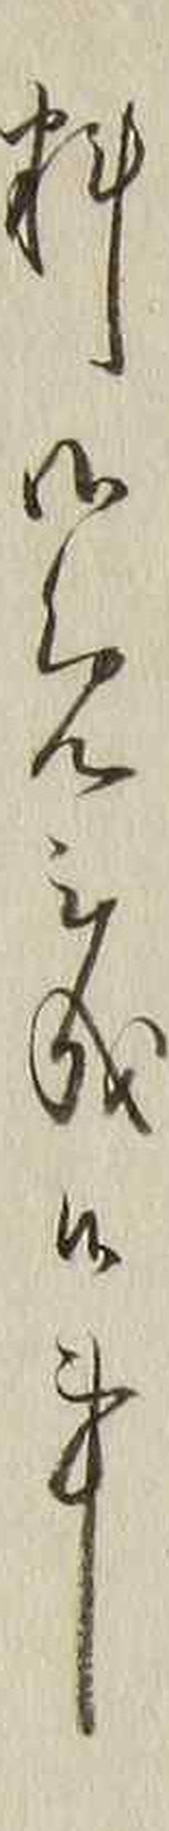料御免被成候事
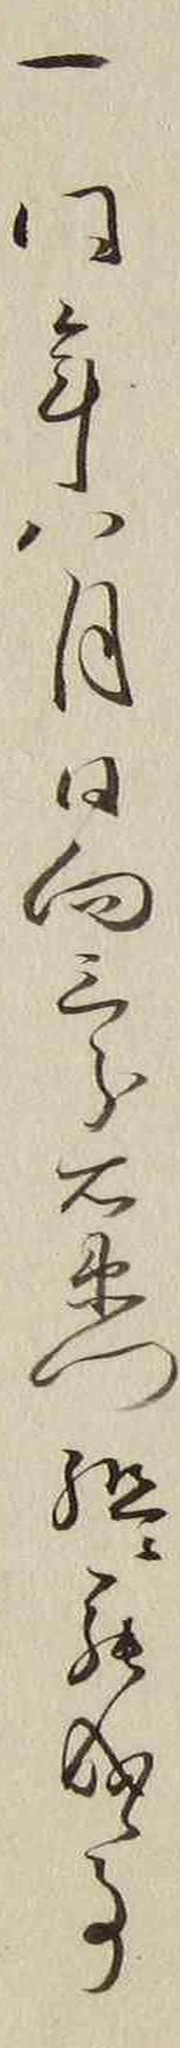一同年八月日向三郎右衛門組ニ罷成候事
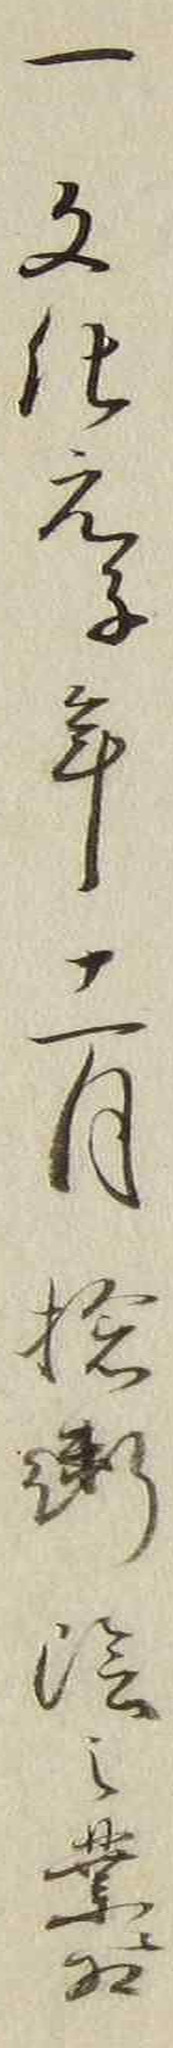一文化元子年十一月槍術陰之業ニ相
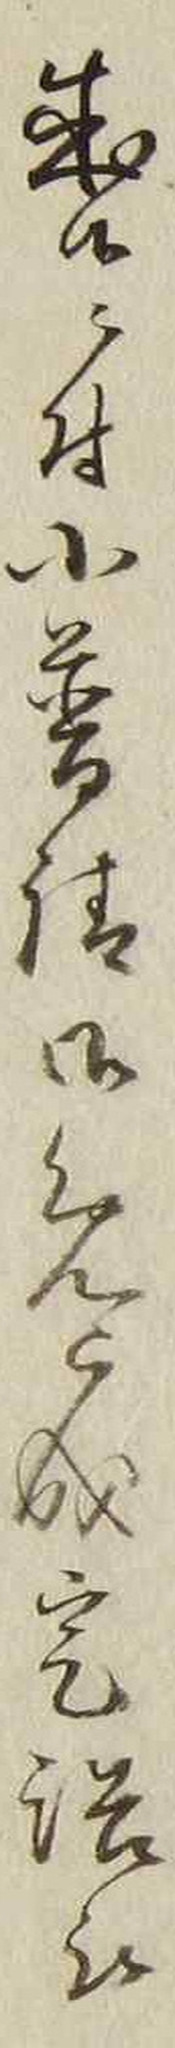成候ニ付小普請御免被成定詰被

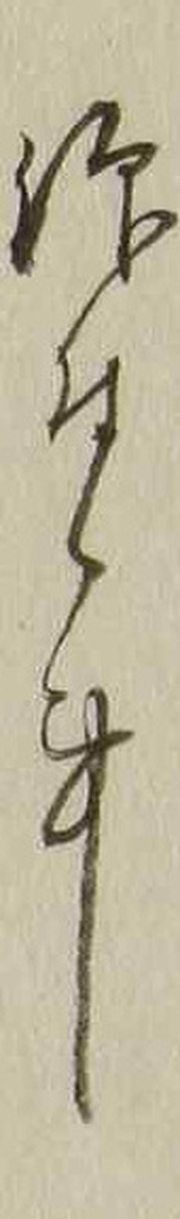仰付候事
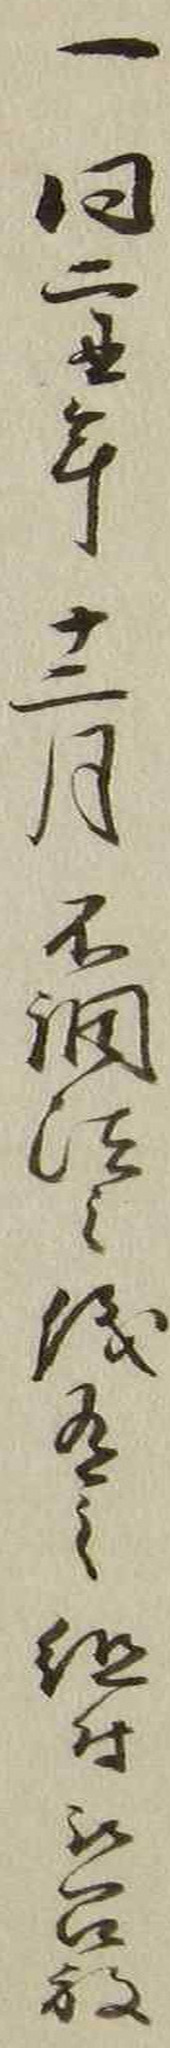一同二丑年十二月不調法之儀有之組付被召放
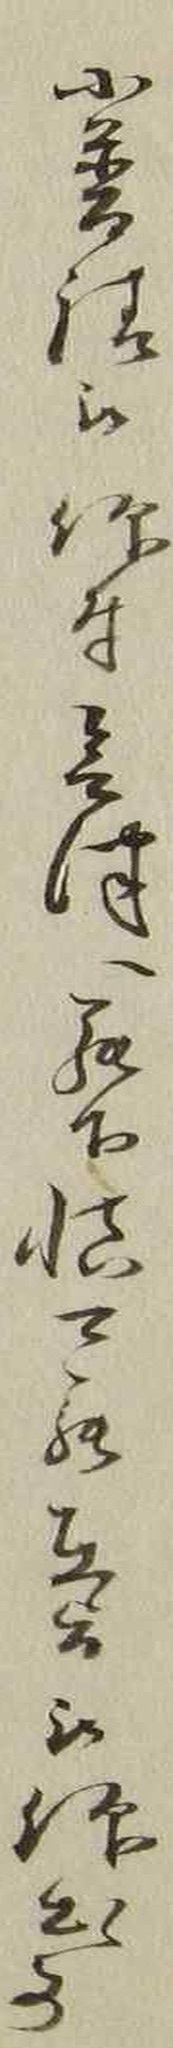小普請被仰付会津へ罷下慎可罷在旨被仰出候事
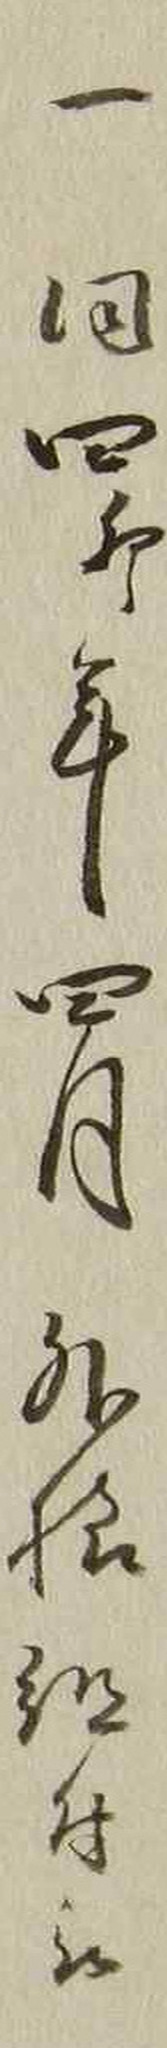一同四卯年四月外様組付被
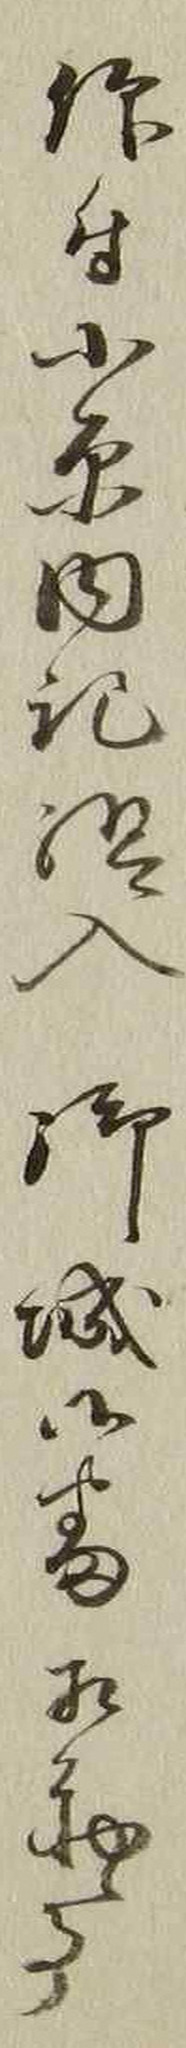仰付小原内記組へ入御城御番相勤候事
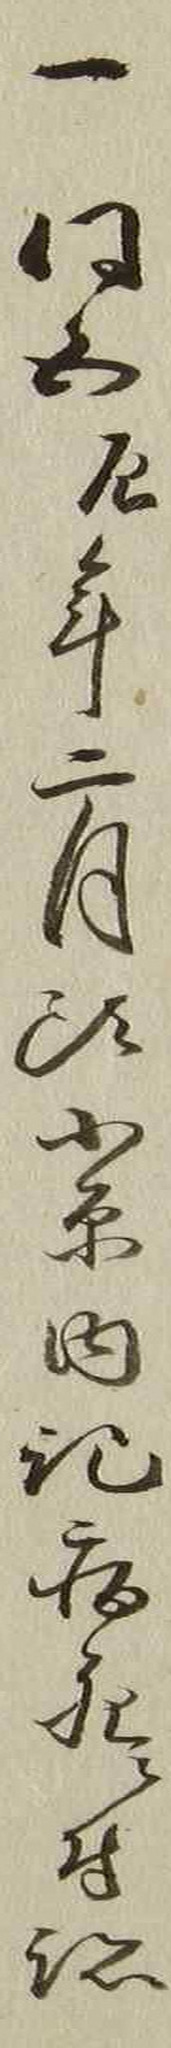一同五辰年二月頭小原内記病死ニ付跡
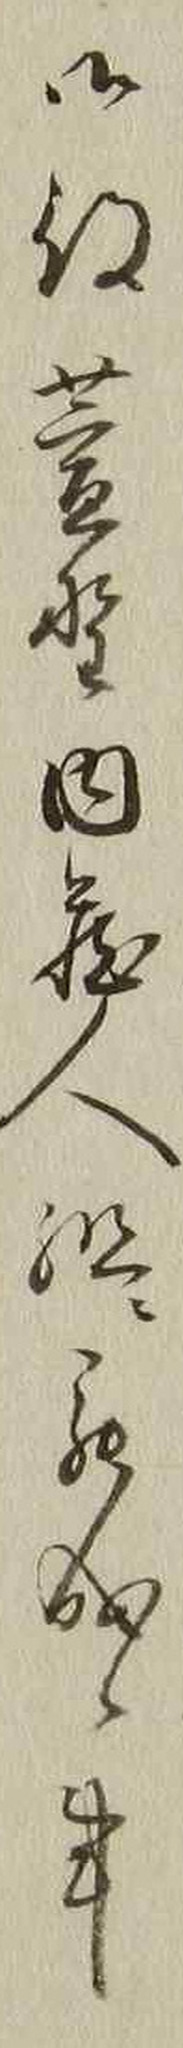御役萱野内蔵人組ニ罷成候事
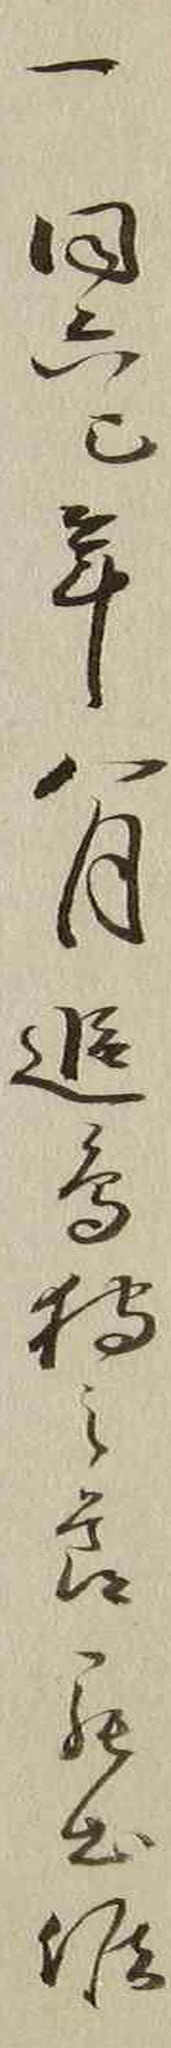一同六巳年八月追鳥狩之節罷出候
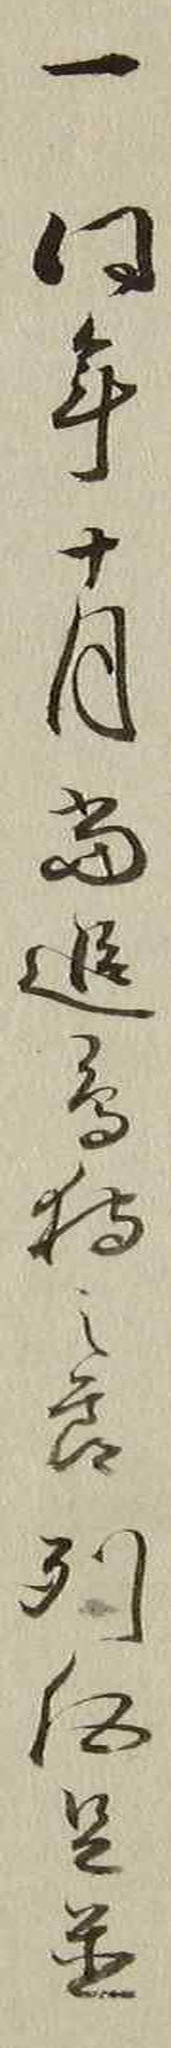一同年十月当追鳥狩之節列伍足並
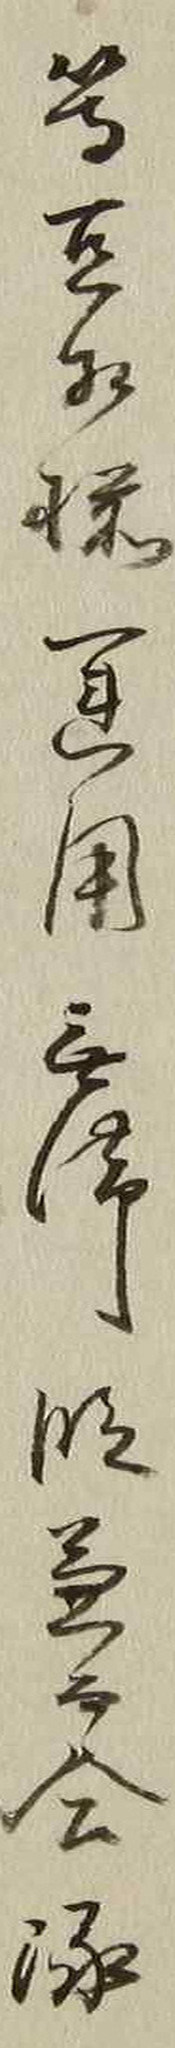等宜相揃運用無滞段兼而合隊
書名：諸士系譜　巻之28　い之部28
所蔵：会津若松市立会津図書館
